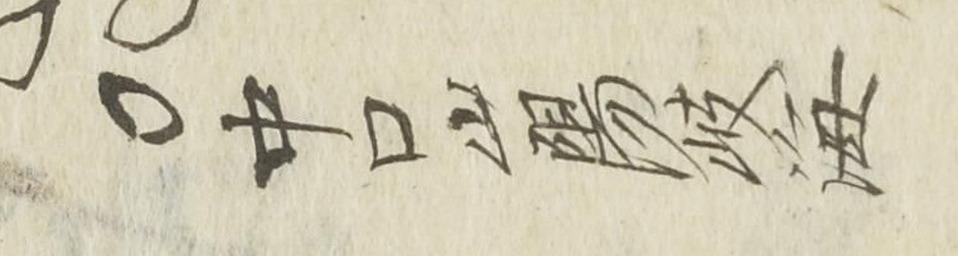中口山陽岐海

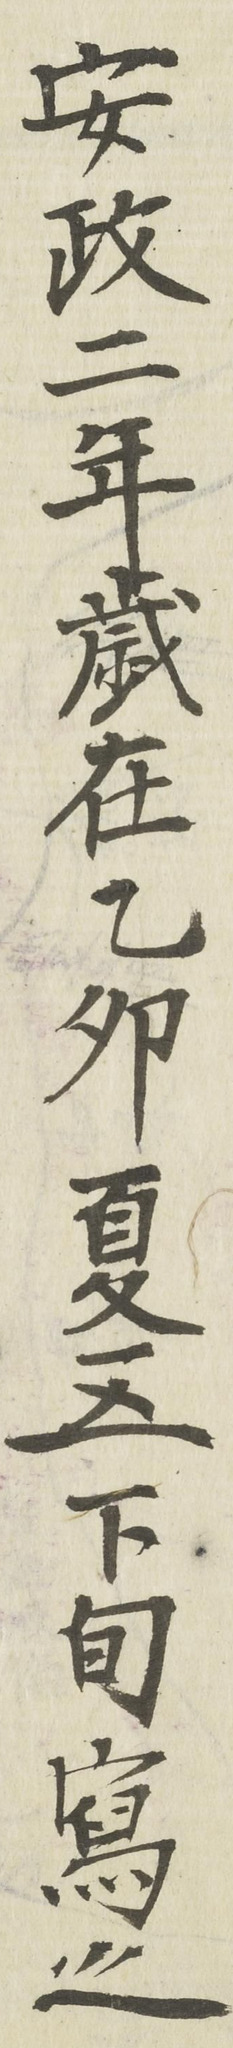安政二年歳在乙卯夏五下旬写之
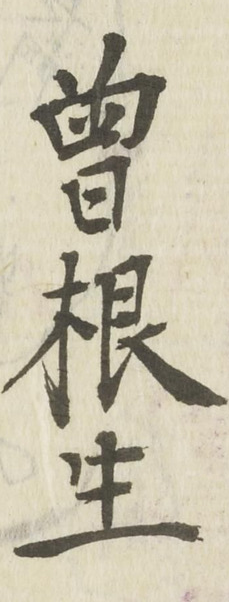曽根生
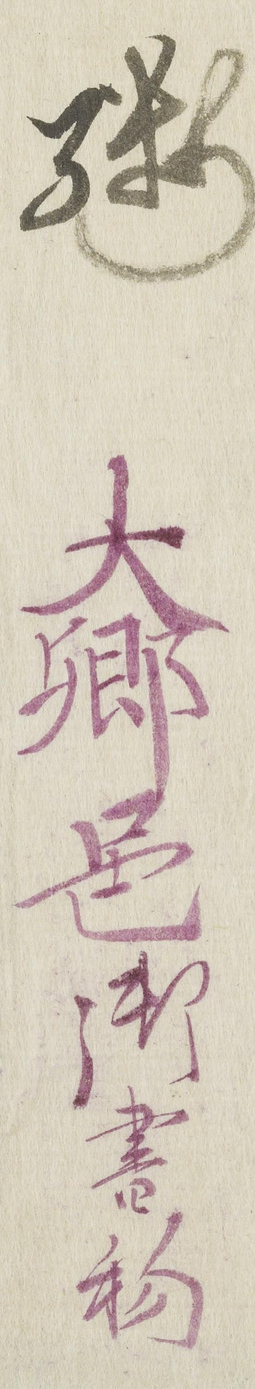大郷邑御書物
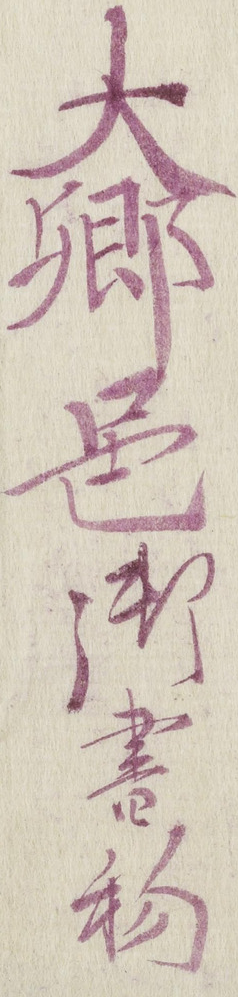大郷邑御書物
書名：海翻考　全
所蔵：東京大学地震研究所図書室 Earthquake Research Institute Library, The University of Tokyo, JAPAN
